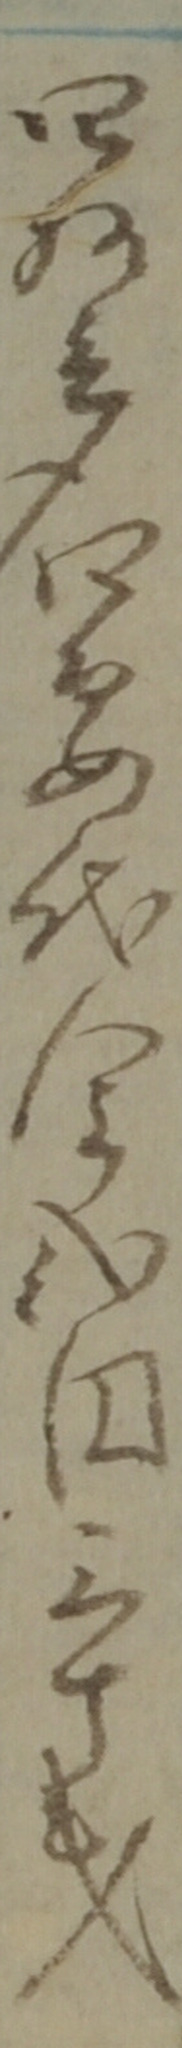四荷壱〆四百め代金二百三十銭
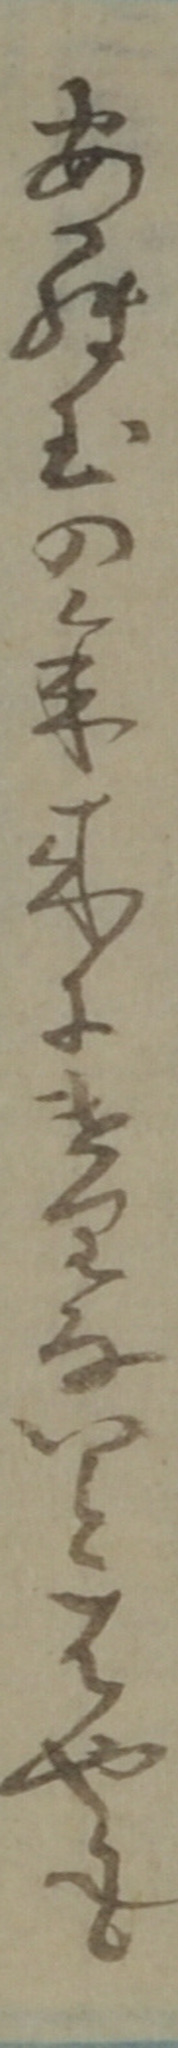あら玉の年来にけりないとはやも
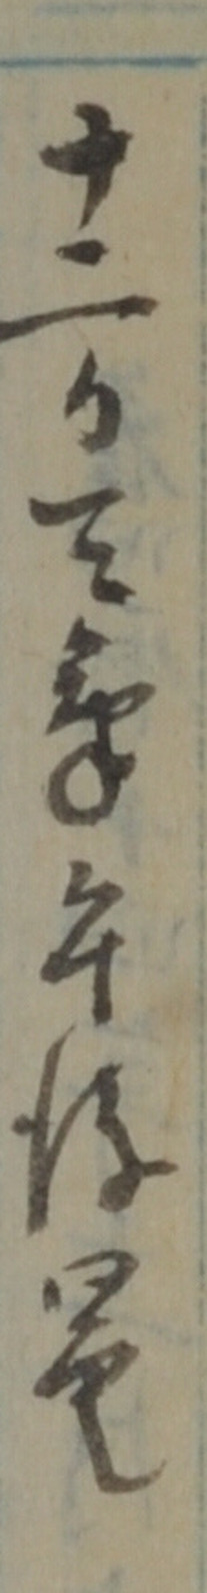十二日天気午後曇
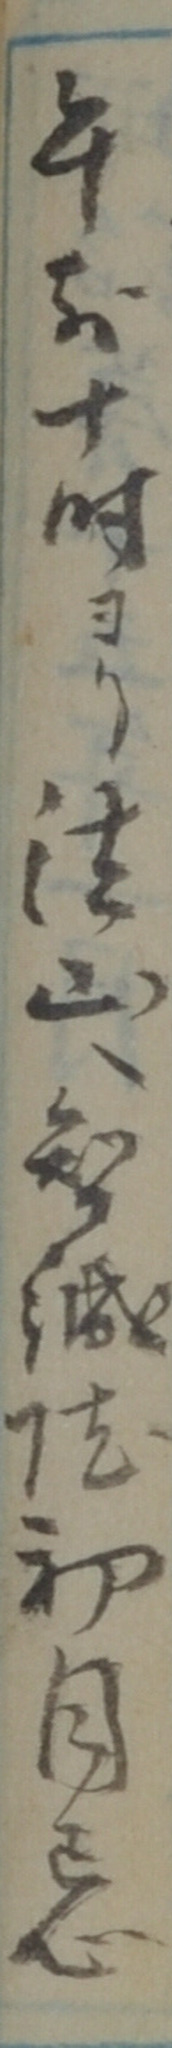午前十時ヨリ法山へ智誠院初月忌
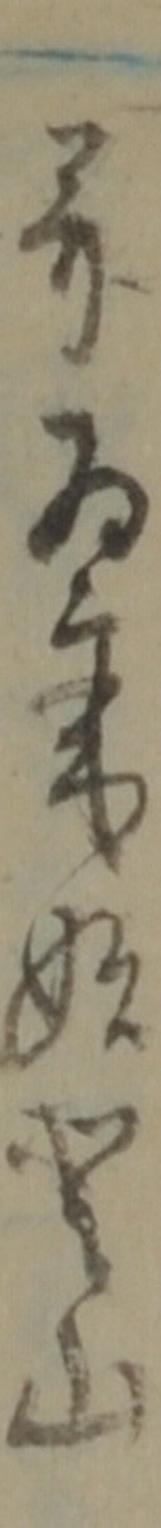并為年始登山
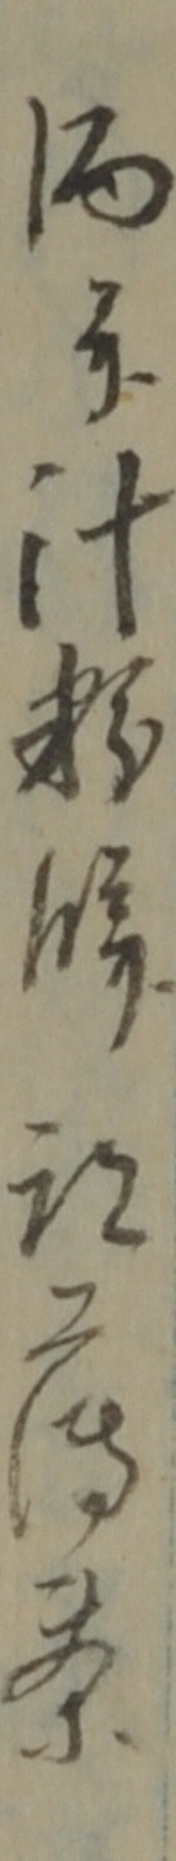酒并汁粉餅跡薄茶
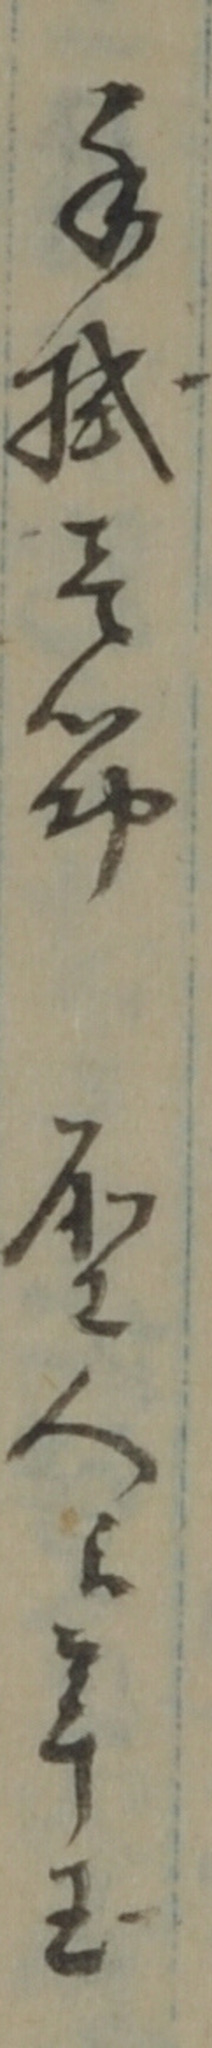手拭壱筋聖人江年玉
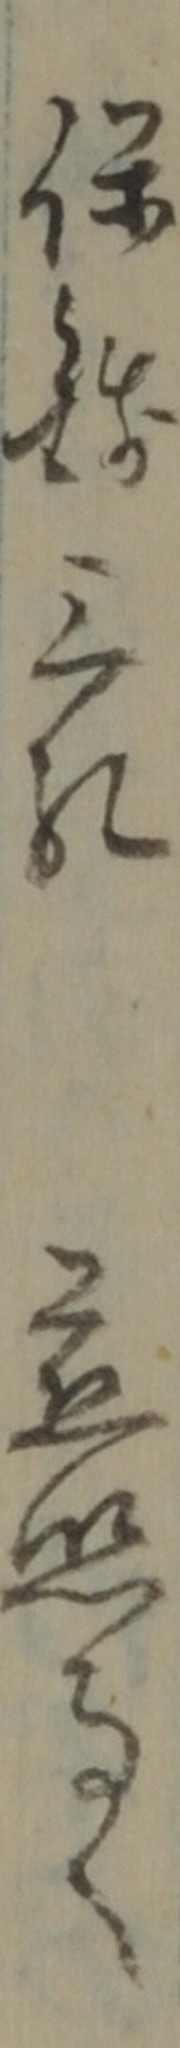保銭三札慈照寺へ
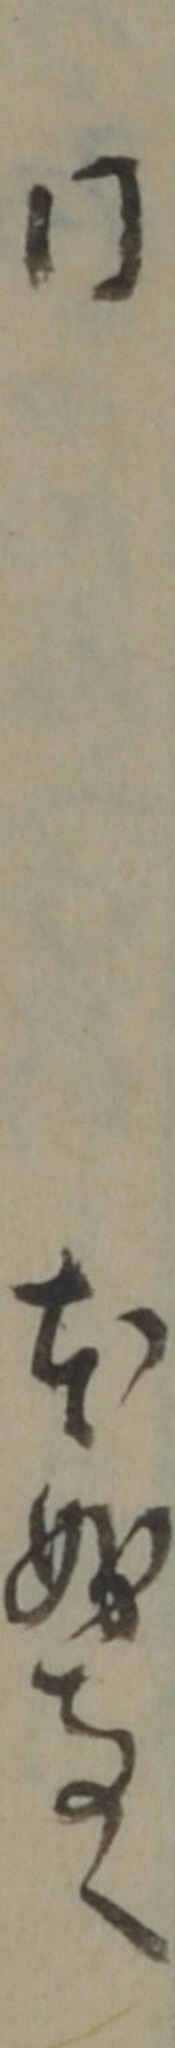同本妙寺へ
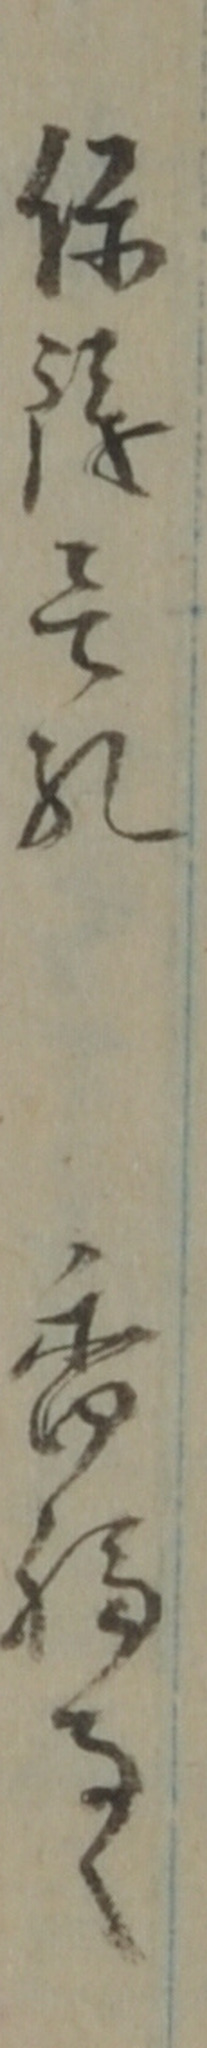保銭壱札香福寺へ
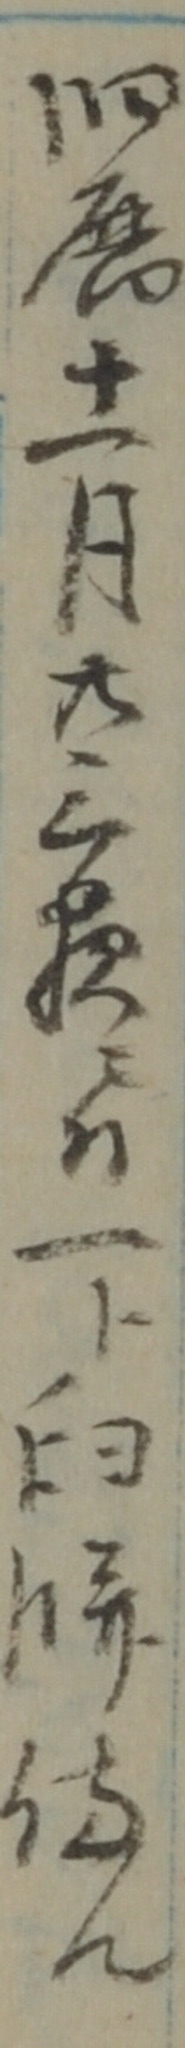旧暦十一月廿三夜ニ御一ト臼餅侍ル

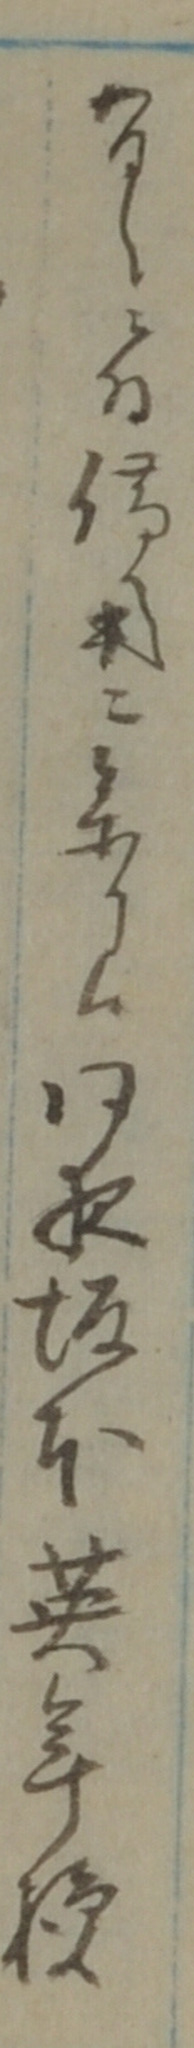有之ニ付借用ニ参リ候同夜坂本英年様
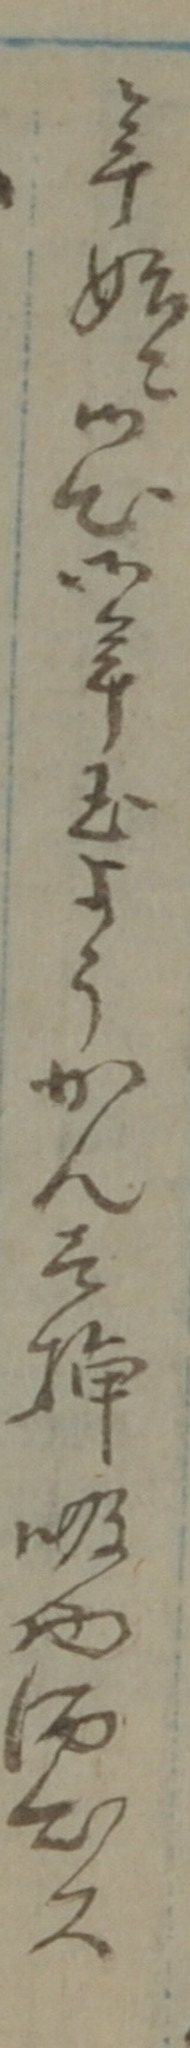年始ニ御心お年玉ようかん壱挿吸物酒出ス
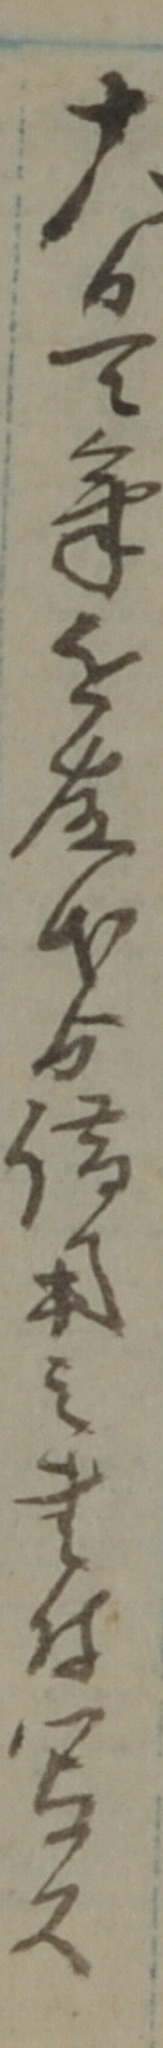十八日天気近藤十衛門借用之書付写ス
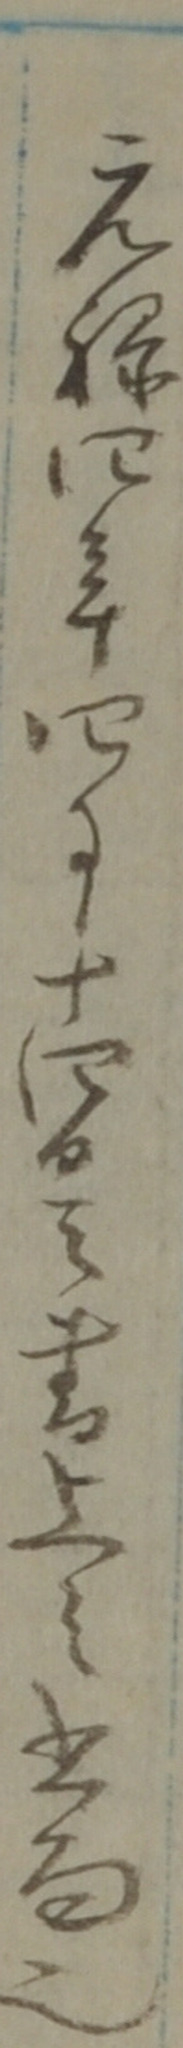元禄四年四月十四日之書上之書面也
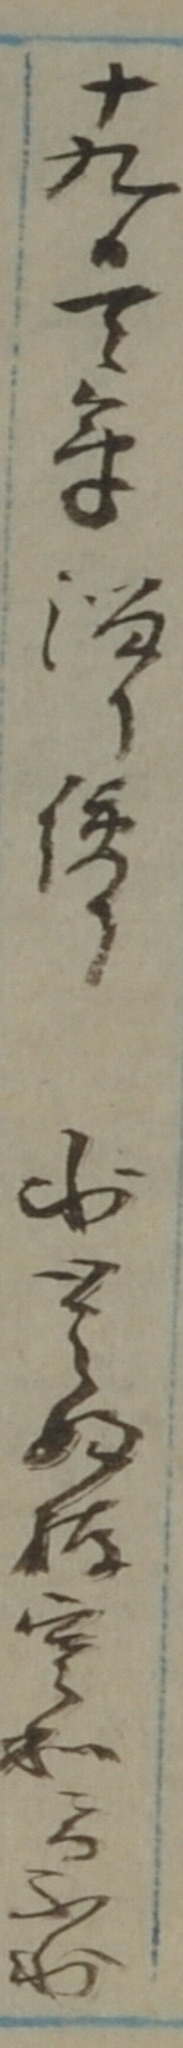十九日天気溜リ絞リ氷とし始拵寒和ニ而不氷
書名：機械製糸所日記
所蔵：伊那市立高遠町図書館・合同会社AMANE
